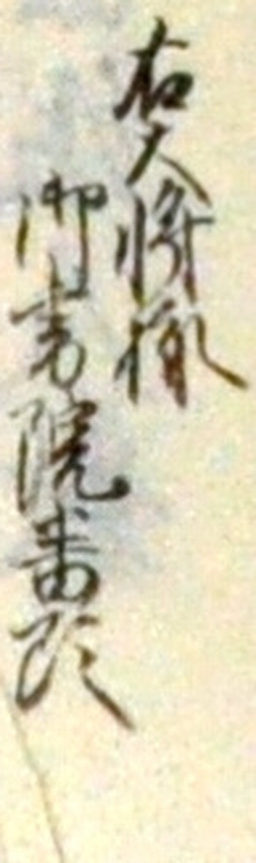御書院番頭

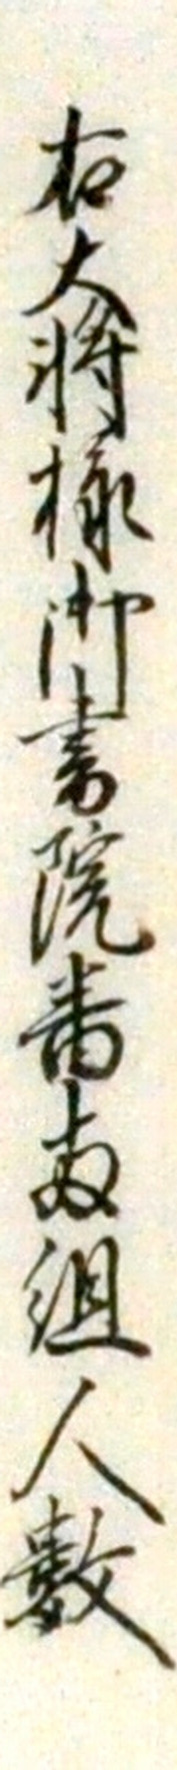右大将様御書院番両組人数
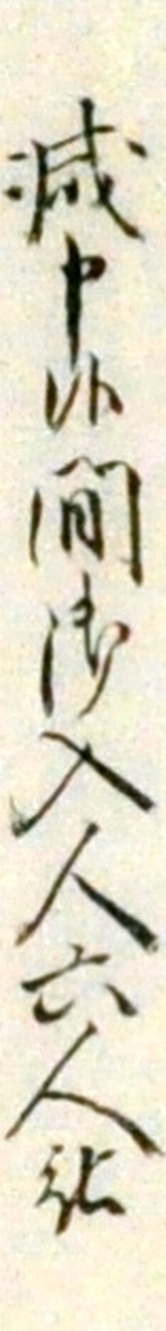減申候間御入人六人被
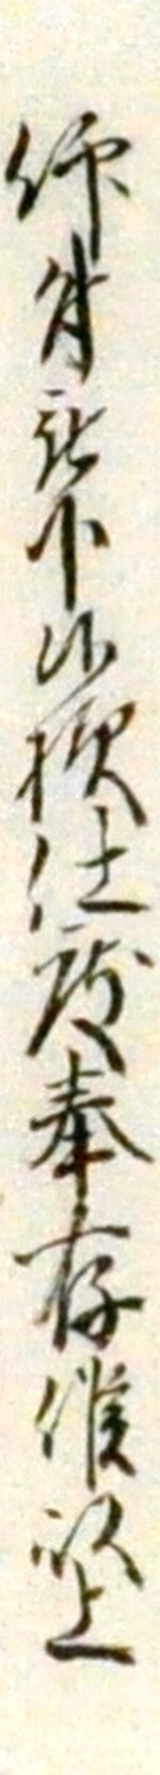仰付被下候様仕度奉存候以上
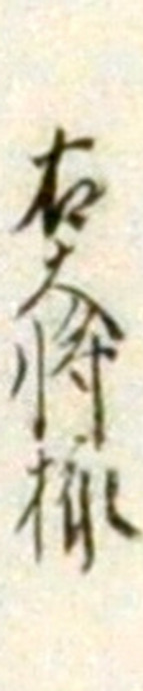右大将様

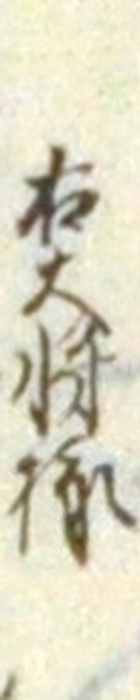右大将様

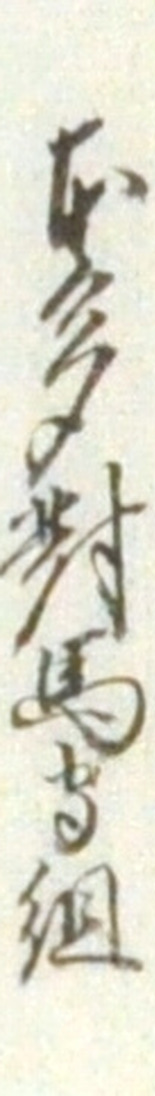本多対馬守組
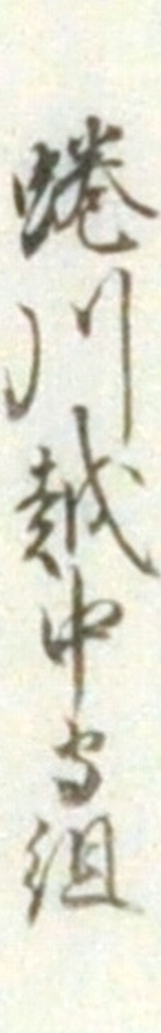蜷川越中守組
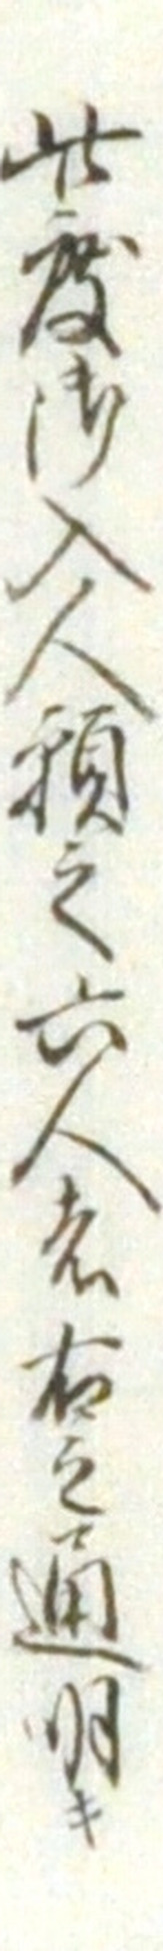此度御入人願之六人者右之通明キ
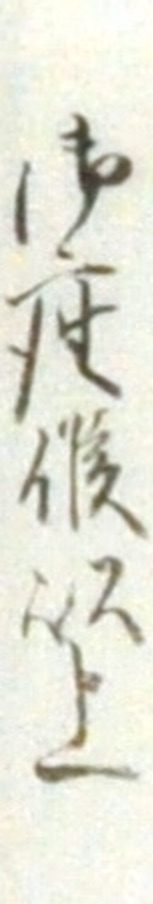御座候以上
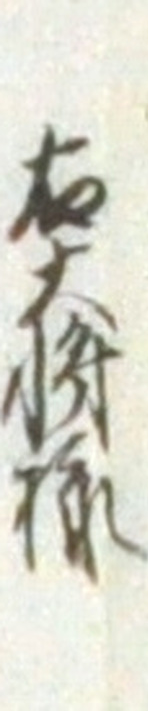右大将様

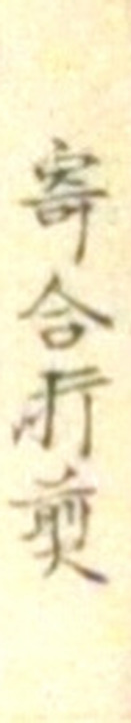寄合肝煎

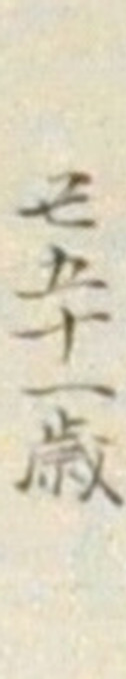丑五十一歳
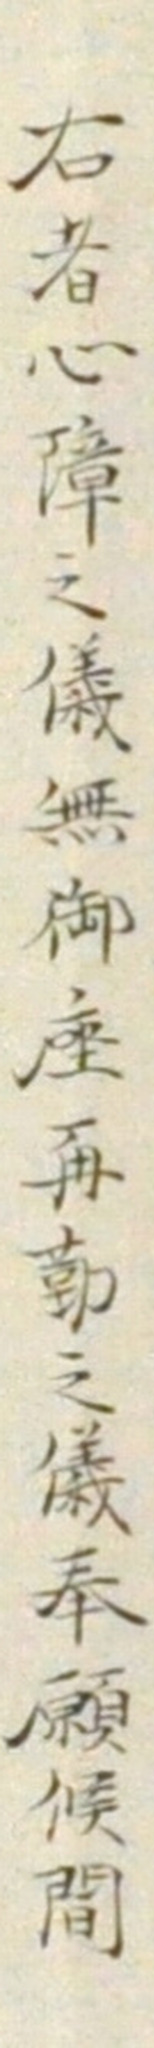右者心障之儀御座再勤之儀奉願候間
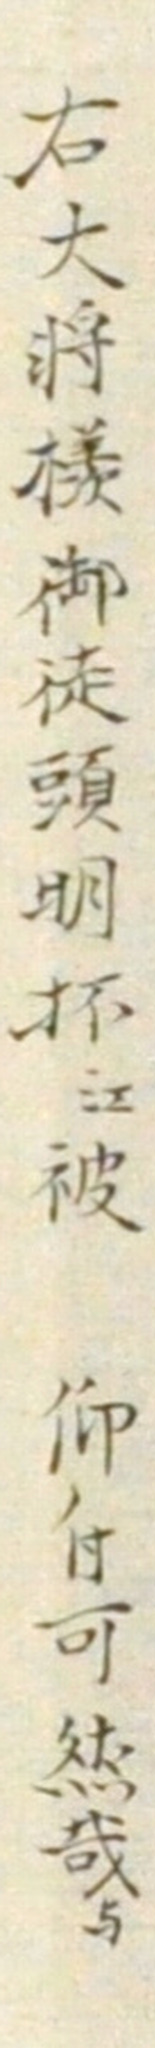右大将様御徒頭明抔江被仰付可然哉与
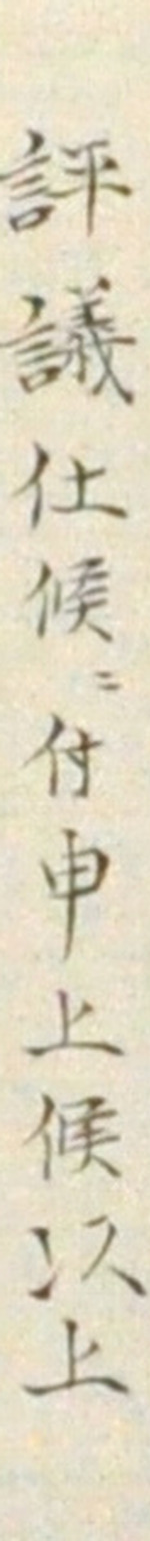評議仕候ニ付申上候以上
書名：若年寄御役中御調書付
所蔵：伊那市立高遠町図書館・合同会社AMANE
